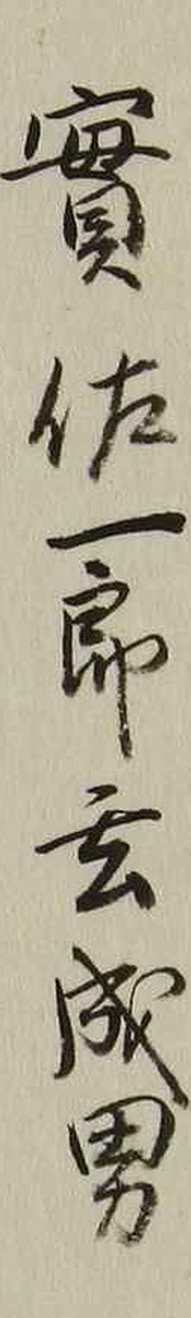実佐一郎玄成男
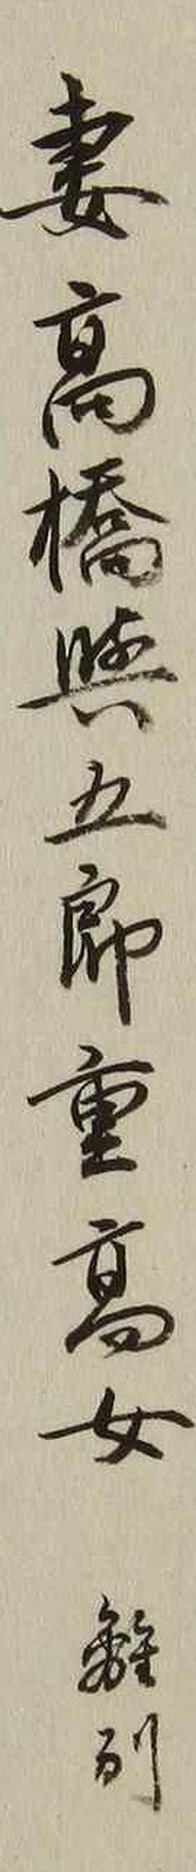妻高橋輿五郎重高女離別
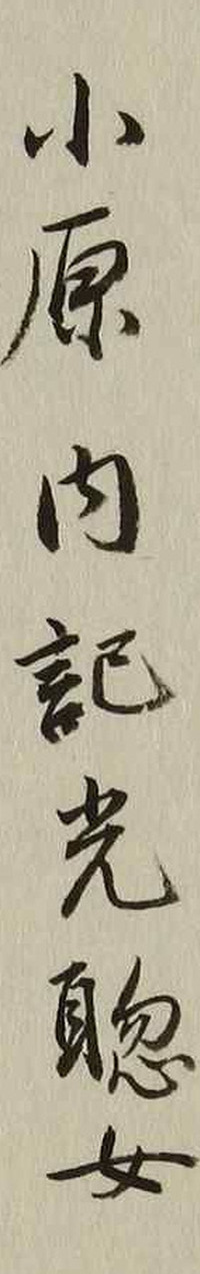小原内記光聦女
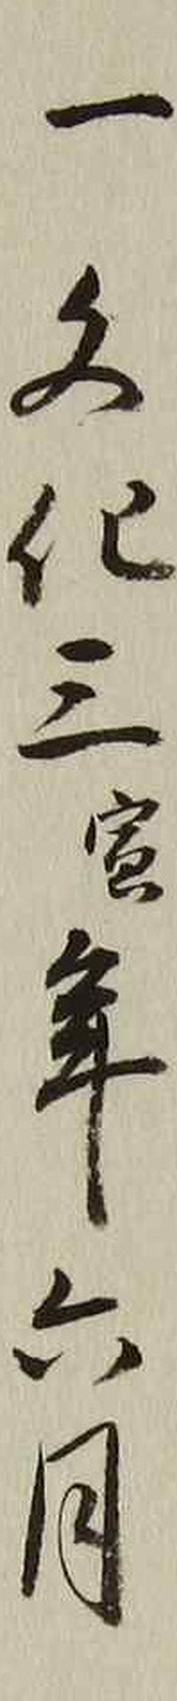一文化三寅年六月候
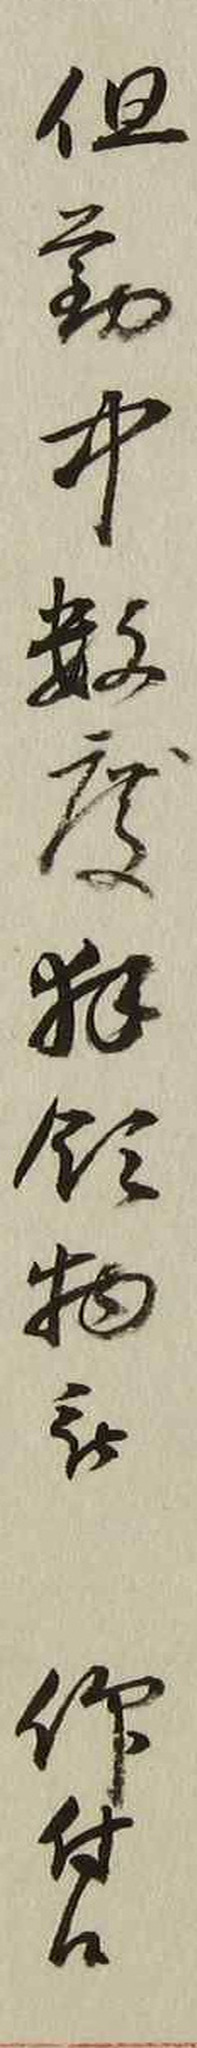但勤中数度拝領物被仰付候
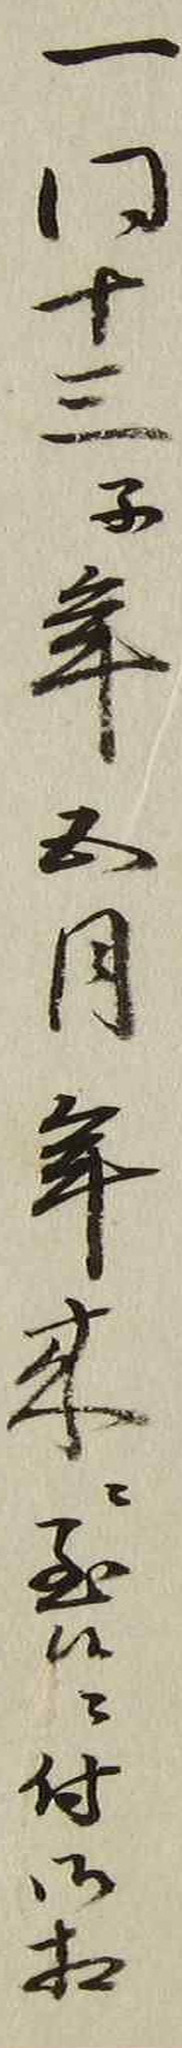一同十三子年五月年來に至候に付御相
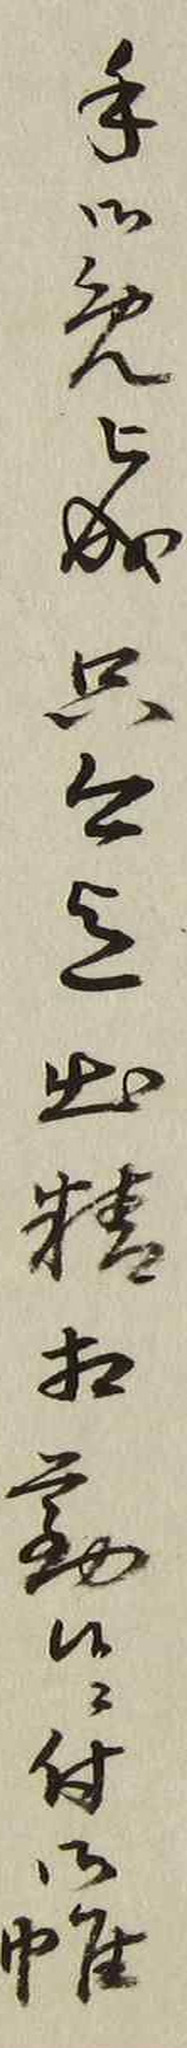手御免被成只今迄出精相勤候に付御帷
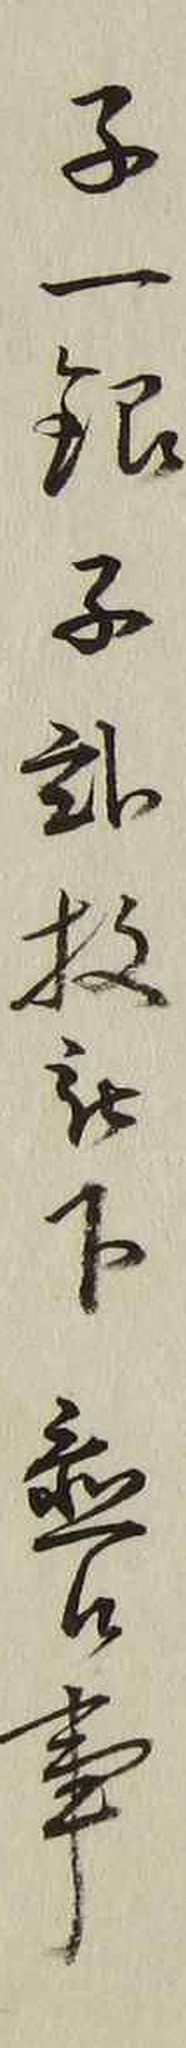子一銀子弐枚被下置候事
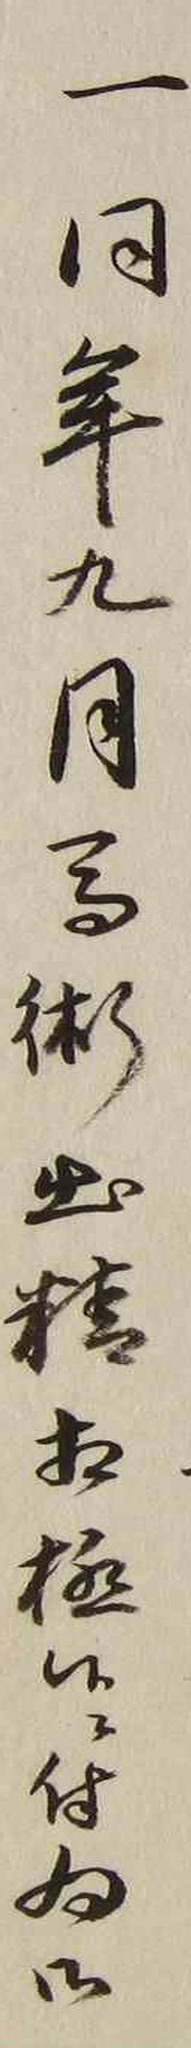一同年九月馬術出精相極候に付為御
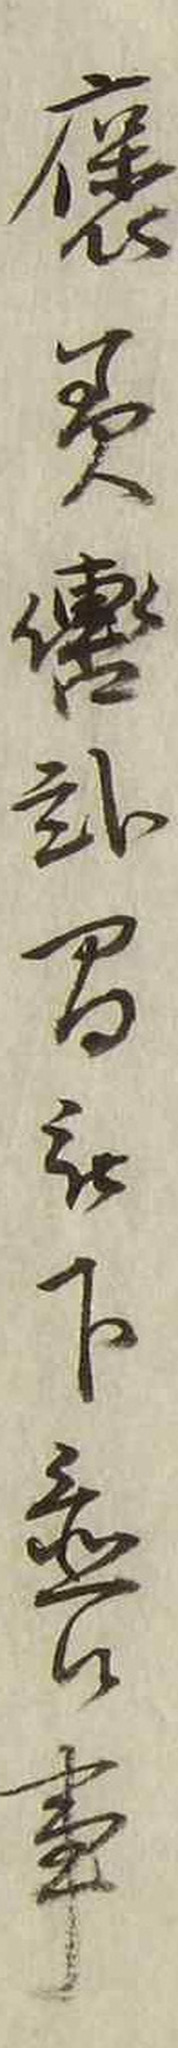褒美轡弐間被下置候事

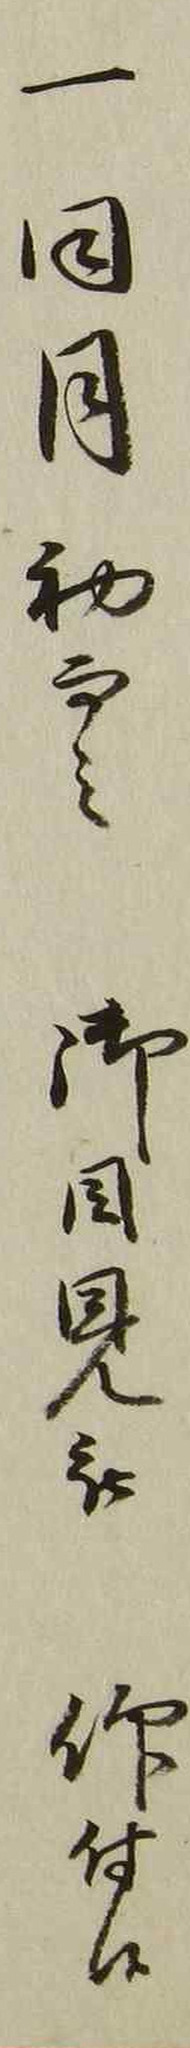一同月初而之御目見被仰付候
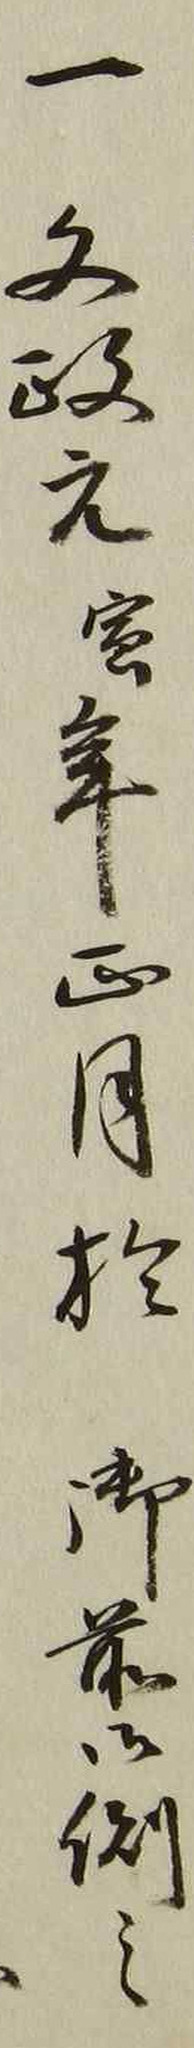一文政元寅正月於御前御側之
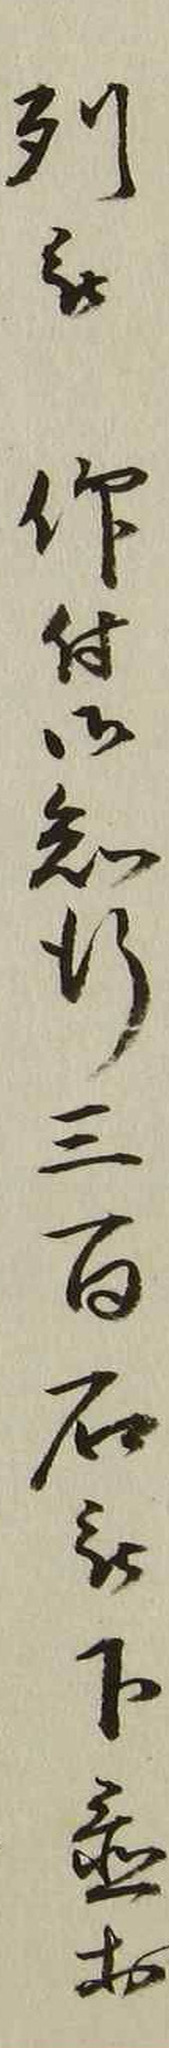列被仰付御知行三百石被下置於
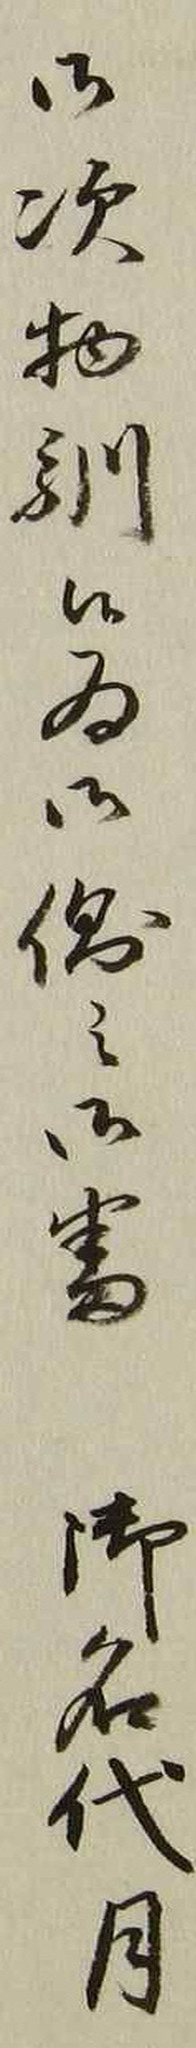御次物馴候為御側之御番御名代月
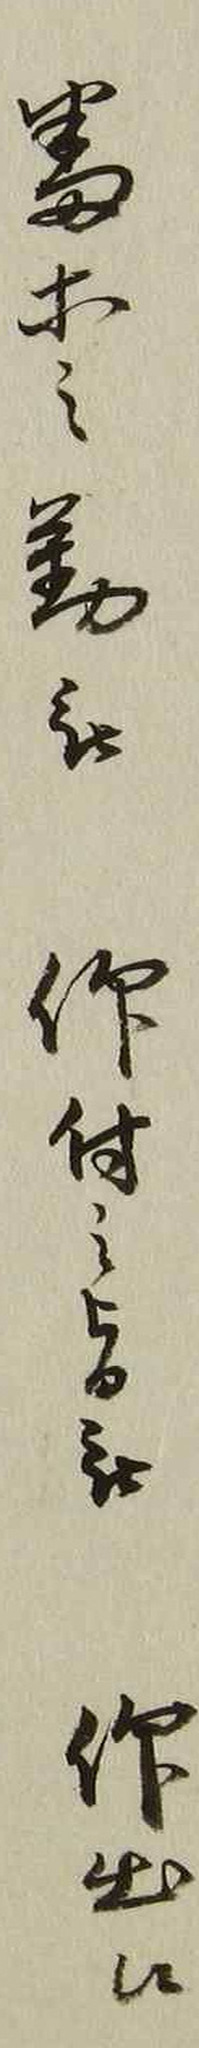番等之勤被仰付之旨被仰出候
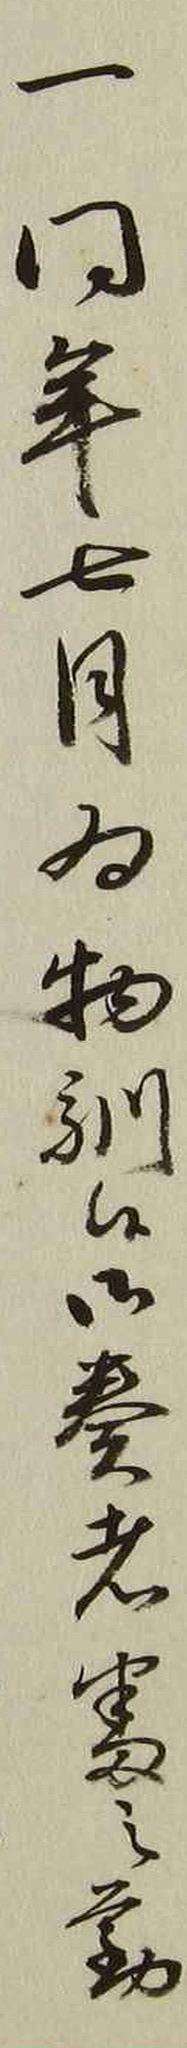一同年七月為物馴候御奏者番之勤
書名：諸士系譜　巻之125　た之部1
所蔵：会津若松市立会津図書館
